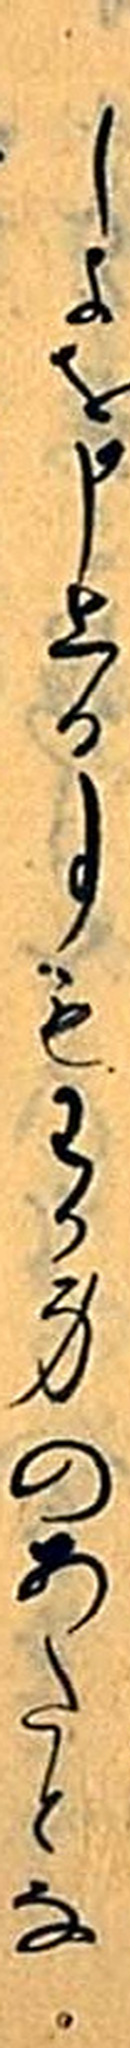しよを申上る事もわか身のあたとな
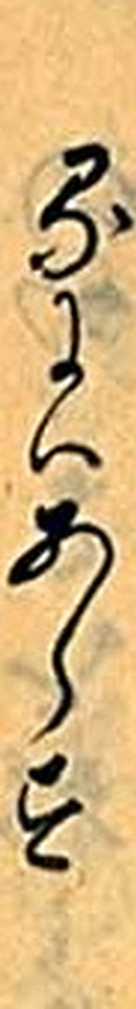るにはあらす
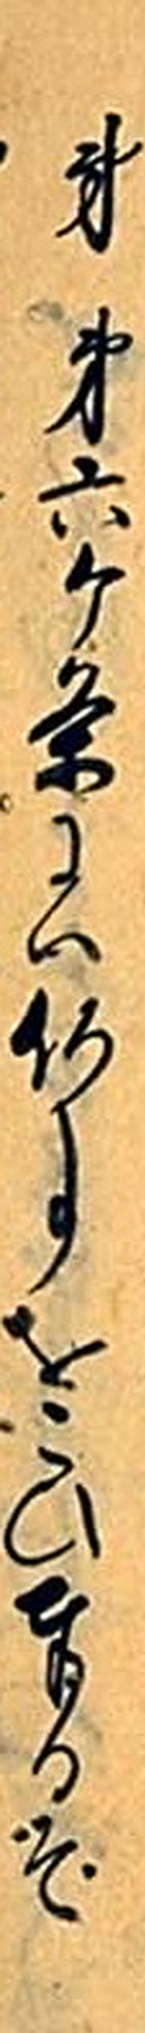弟第六ケ条には何事をこひ奉るそ
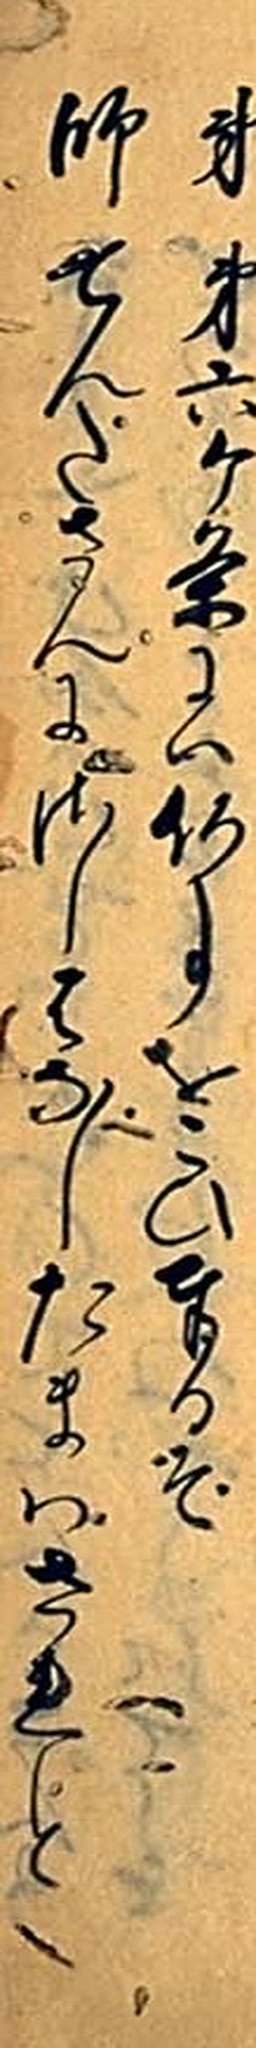師てんたさんにさしはなしたまはされと

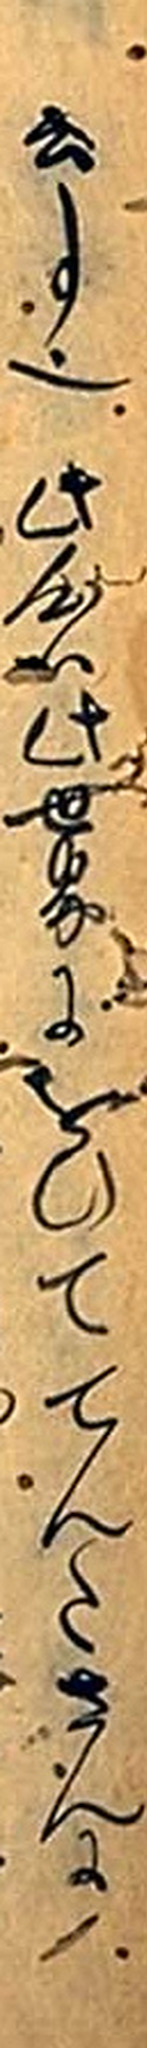云事也此心は此世界にをひててんたさんに
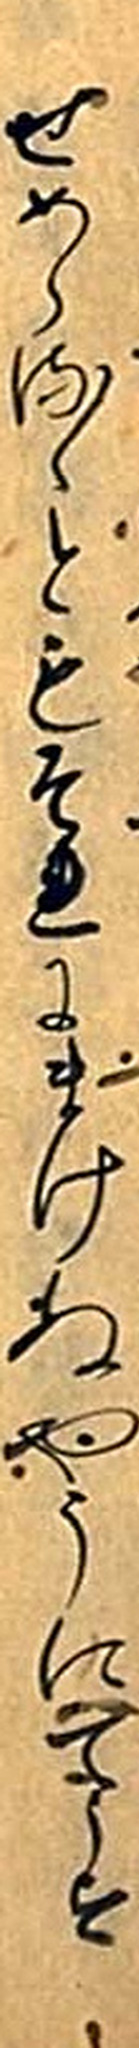せめらるゝともそれにまけぬやうにてうす
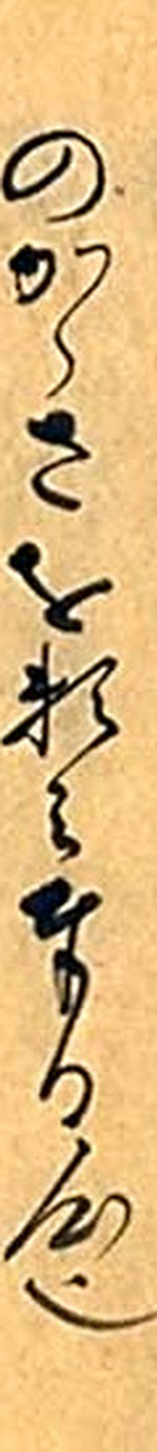のからさを頼み奉る心也
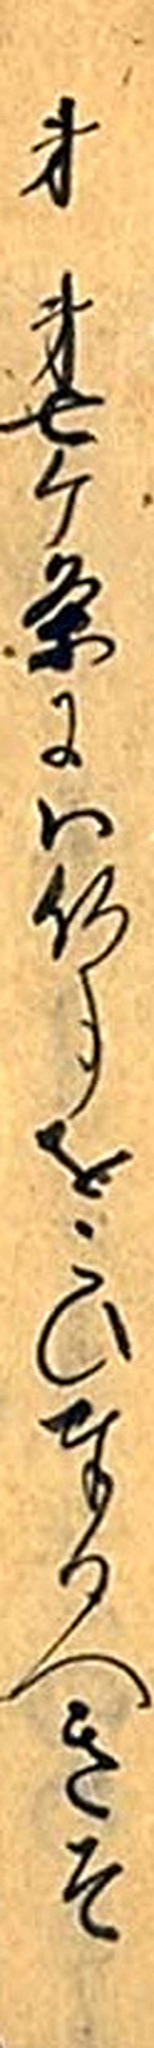弟第七ケ条には何事をこひ奉るへきそ
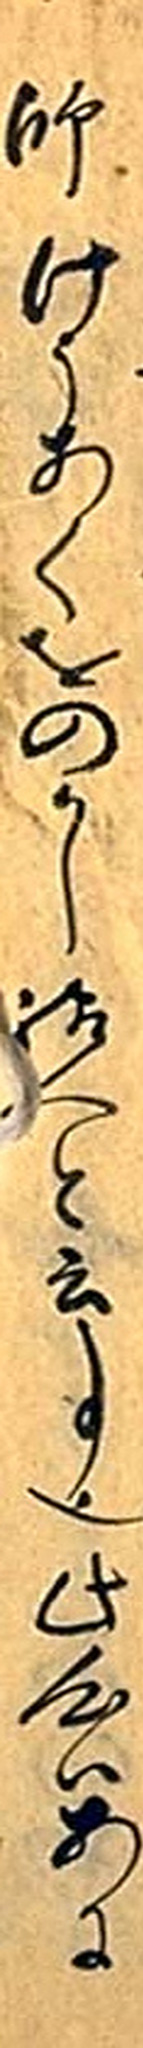師けうあくをのかし給へと云事也此心はあに
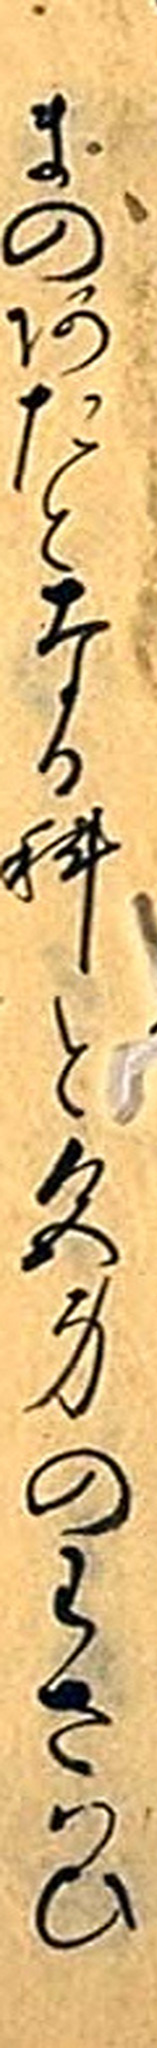まのあたとなる科と色身のわさはひ
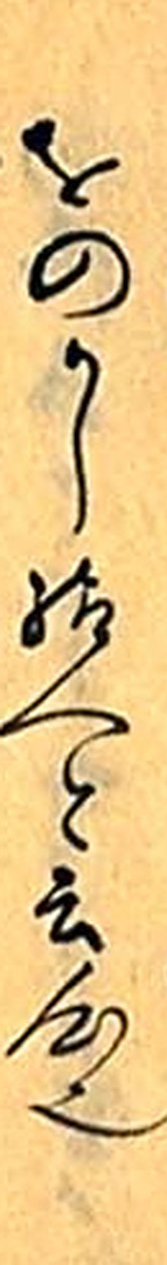をのかし給へと云心也
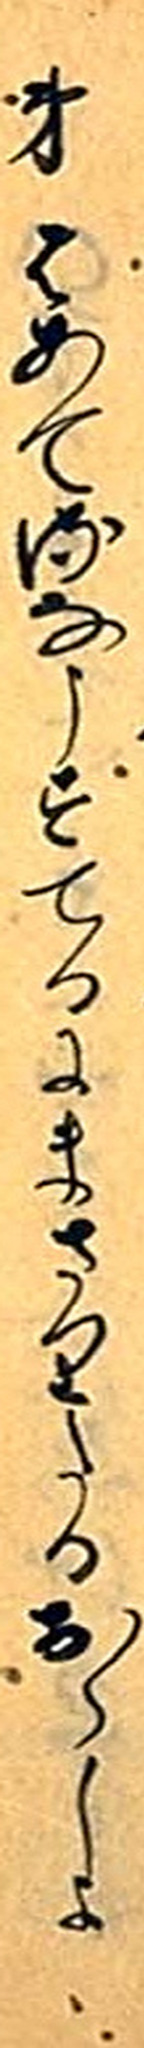弟はあてるなうすてるにまさりたるおらしよ
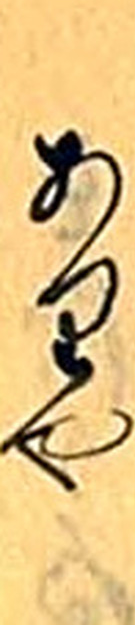ありや
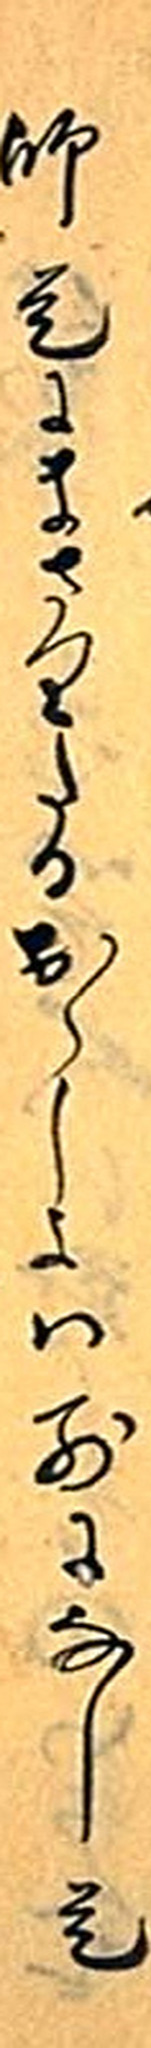師是にまさりたるおらしよは別になし是
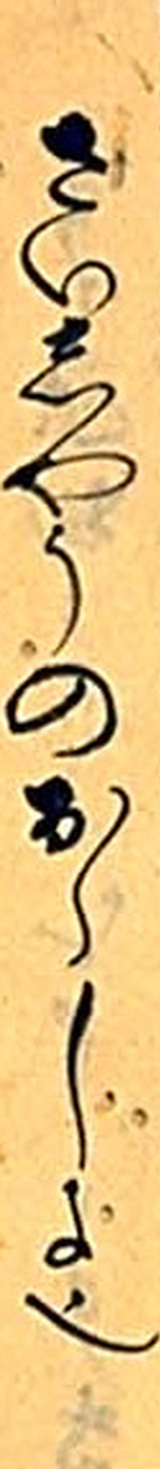さいしやうのおらしよ也
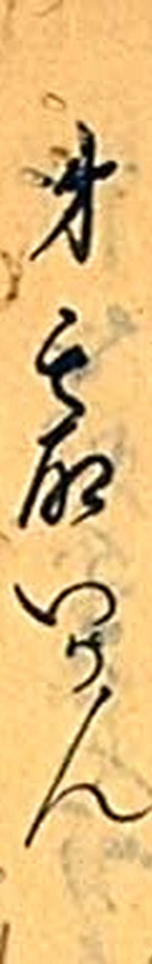弟其故いかん
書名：ドチリナ・キリシタン
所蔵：東京大学総合図書館 / General Library in the University of Tokyo
